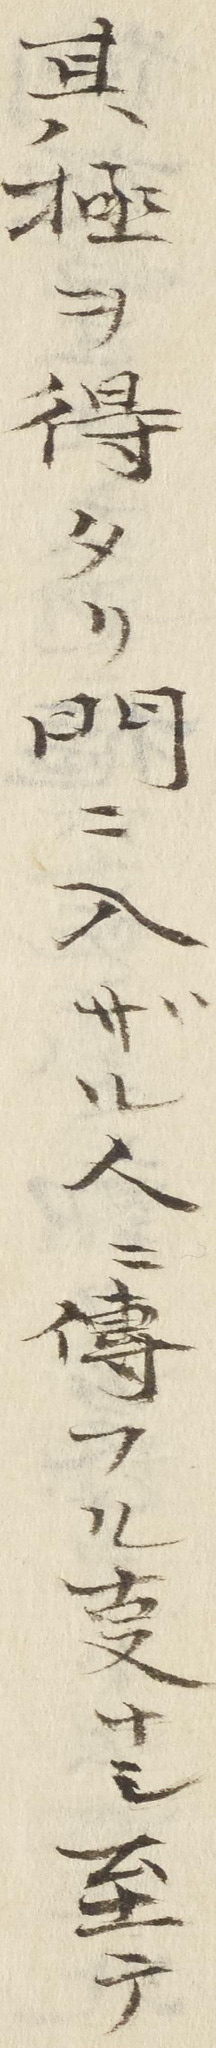其極ヲ得タリ門ニ入ザル人ニ伝フル事ナシ至テ
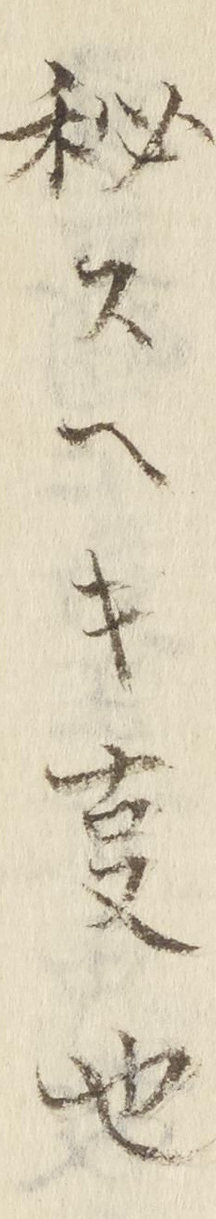秘スヘキ事也
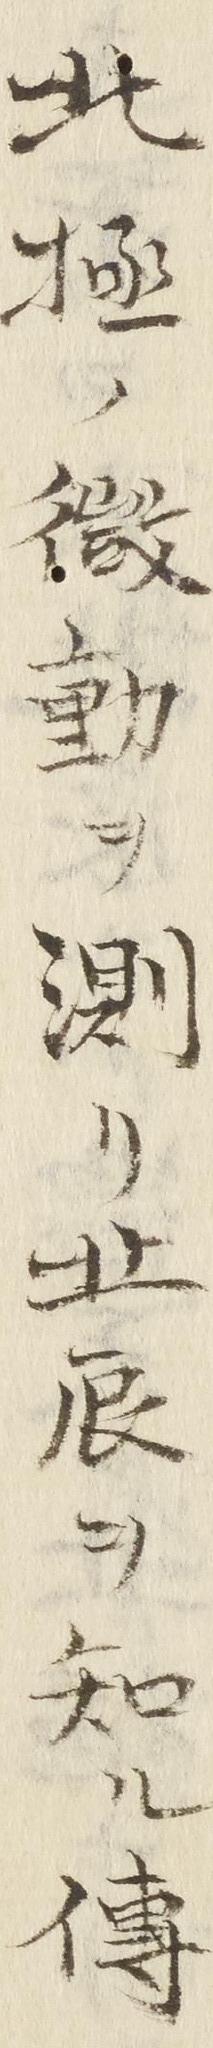北極ノ微動ヲ測リ北辰ヲ知ル伝
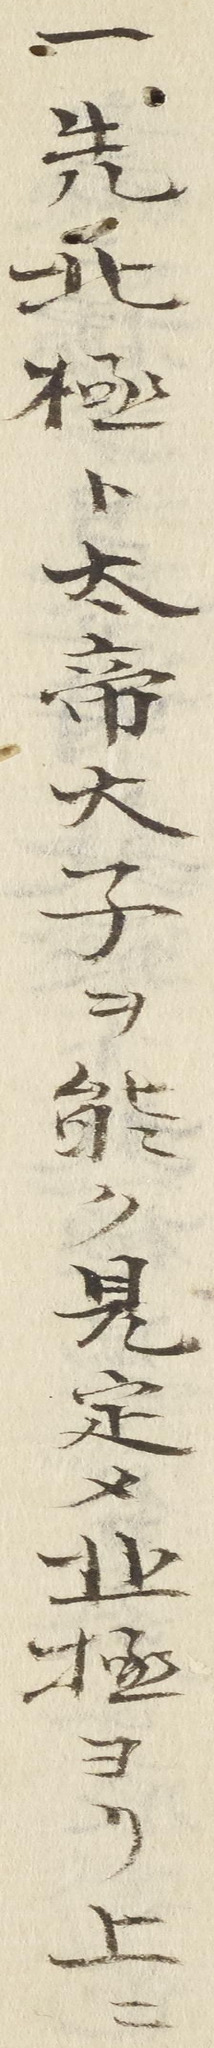一先北極ト太帝大子ヲ能ク見定メ北極ヨリ上ニ
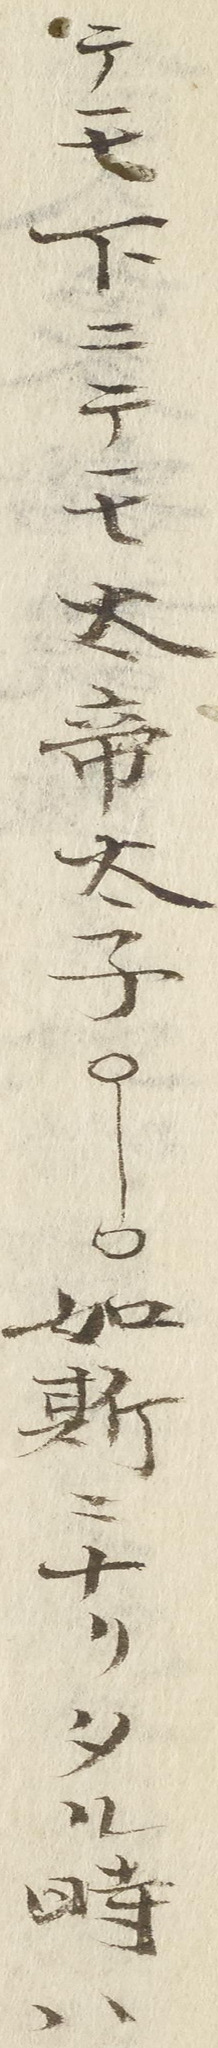テモ下ニテモ太帝太子〇―〇如斯ニナリタル時ハ
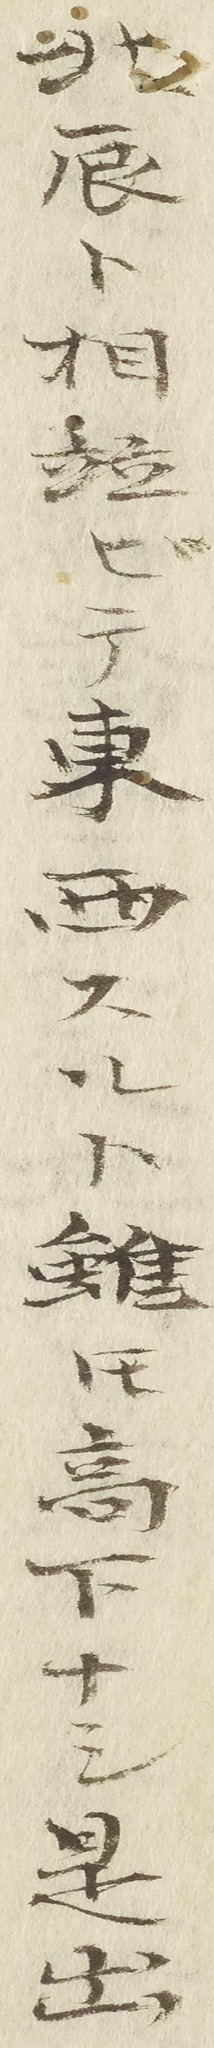北辰ト相並ビテ東西スルト雖トモ高下ナシ是出
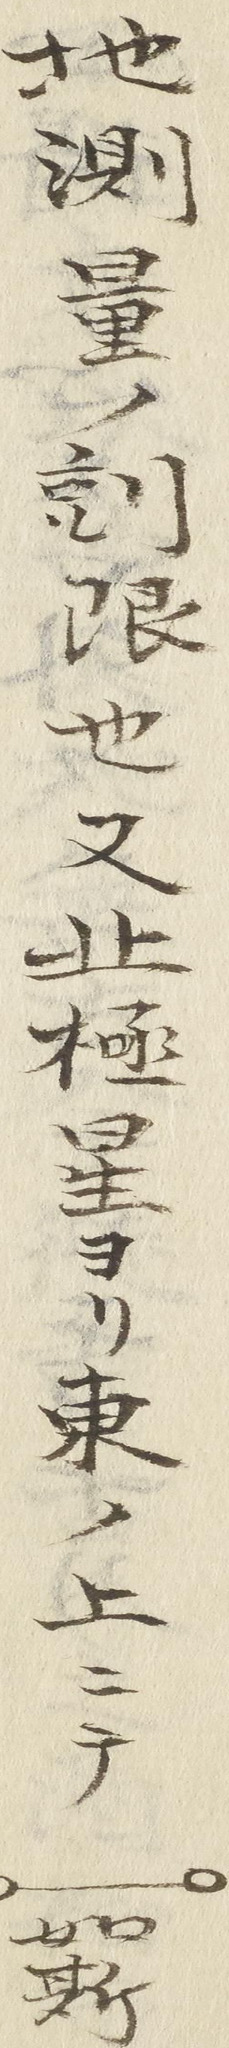地測量ノ剋限也又北極星ヨリ東ノ上ニテ如斯
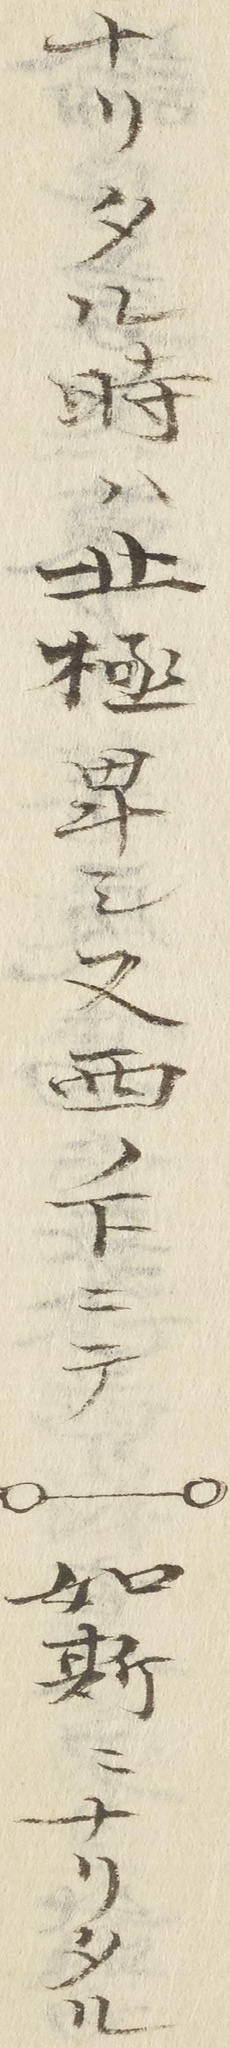ナリタル時ハ北極卑シ又西ノ下ニテ如斯ニナリタル
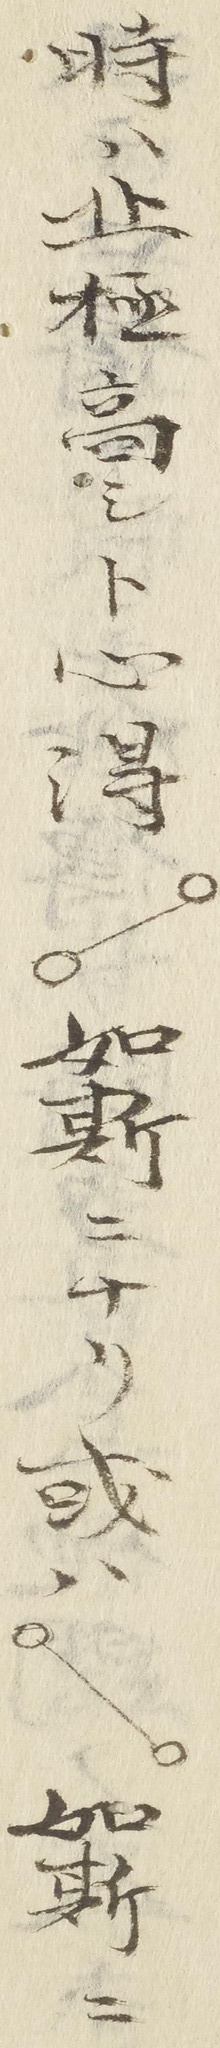時ハ北極高シト心得如斯ニナリ或ハ如斯ニ
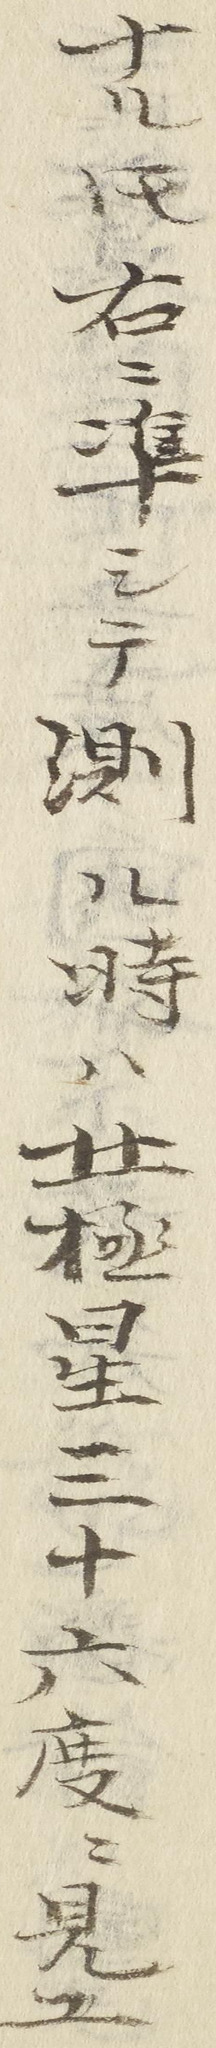ナルトモ右ニ準シテ測ル時ハ北極星三十六度ニ見ユ

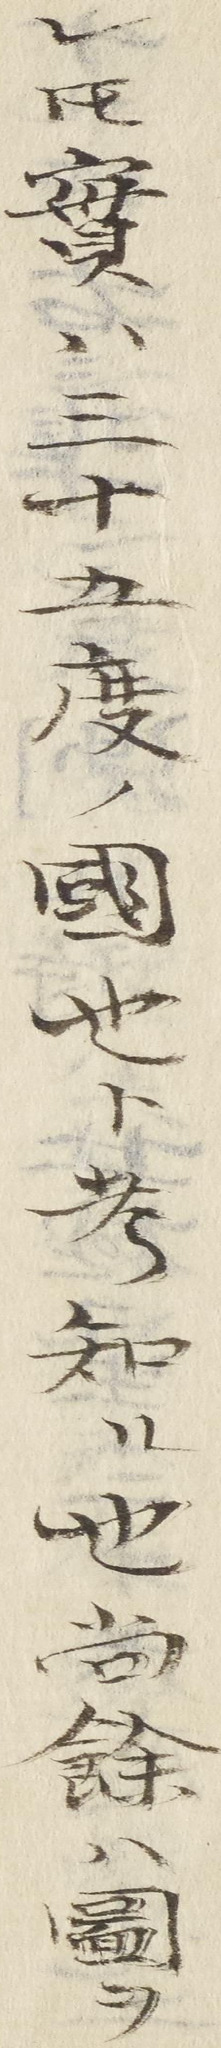レトモ実ハ三十五度ノ国也ト考知ル也尚余ハ図ヲ
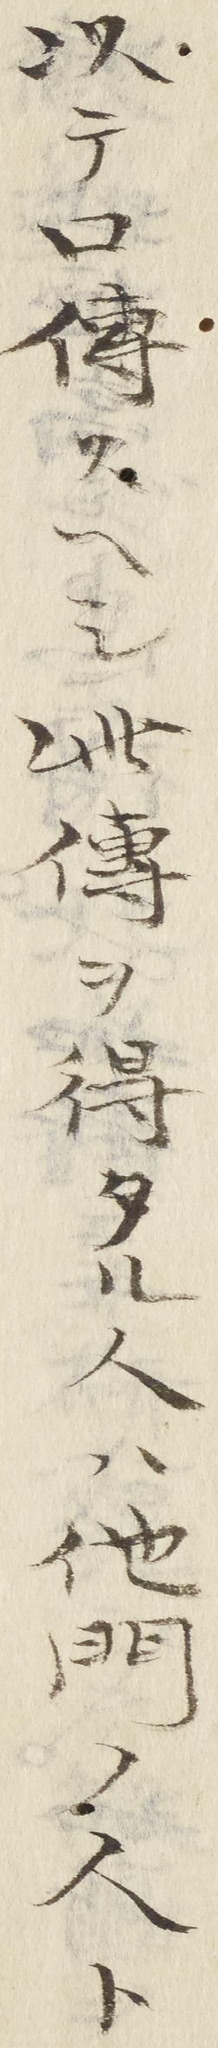以テ口伝スヘシ此伝ヲ得タル人ハ他門ノ人ト
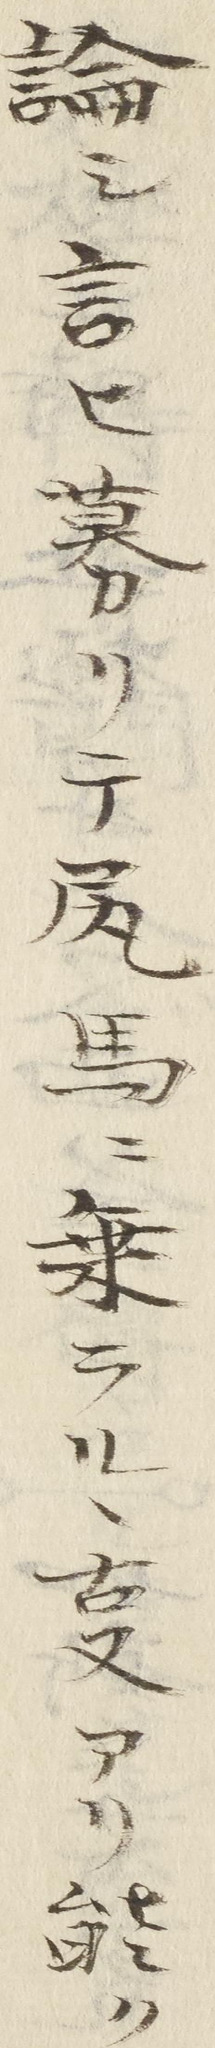論シ言ヒ募リテ尻馬ニ乗ラルヽ事アリ能ク
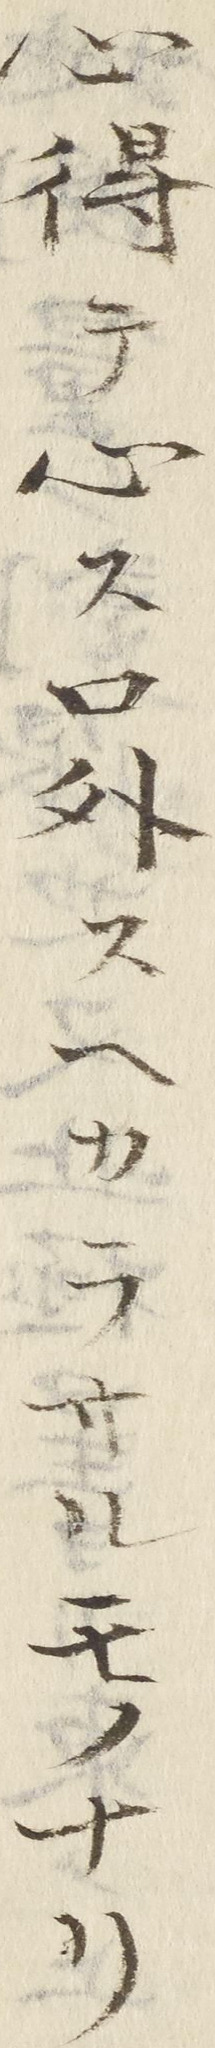心得テ心ス口外スヘカラサルモノナリ
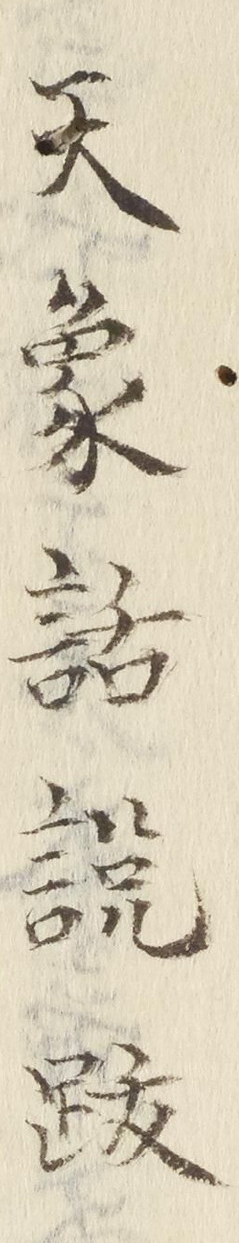天象説話跋
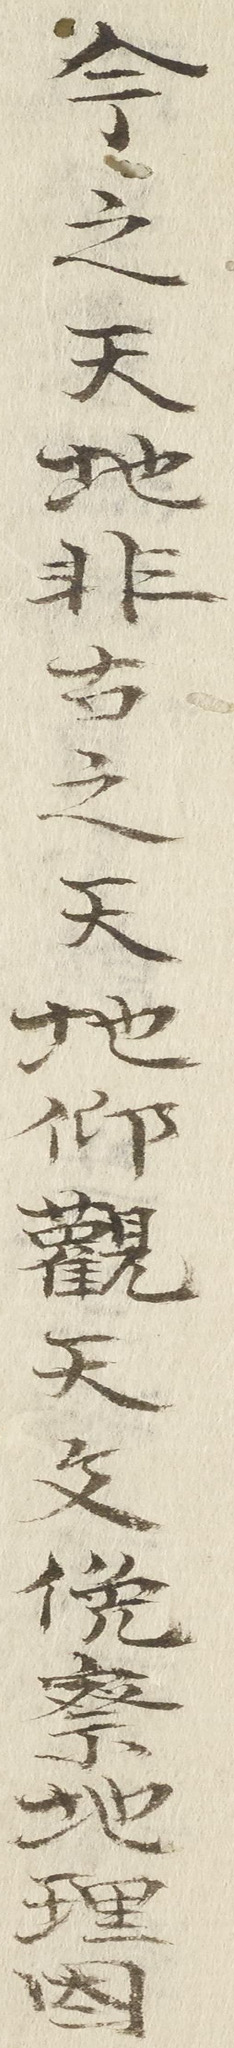今之天地非古之天地仰観天文俛察地理因
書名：天象話説
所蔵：東京大学地震研究所図書室 Earthquake Research Institute Library, The University of Tokyo, JAPAN
